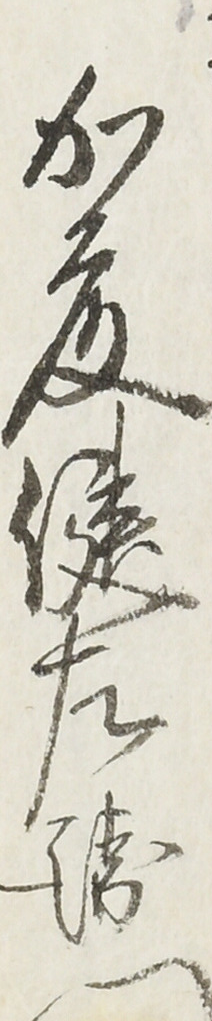加藤健左衛門㊞
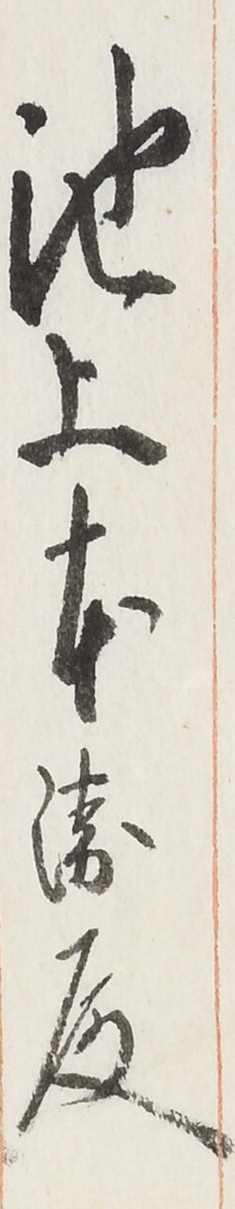池上本衛殿
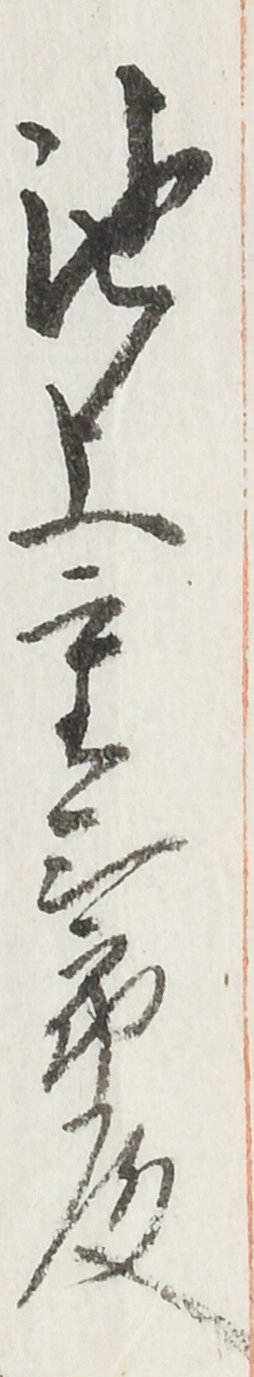池上重三郎殿
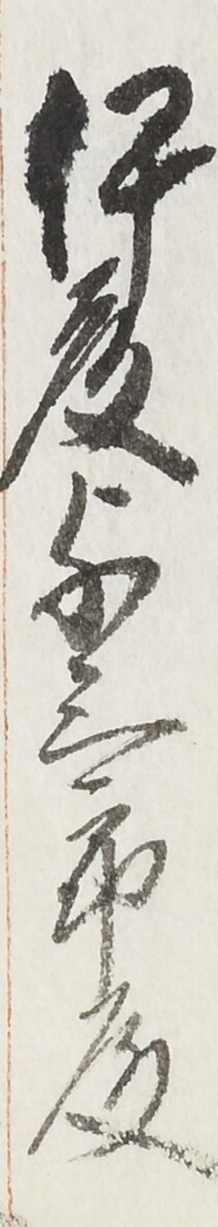伊藤与三郎殿
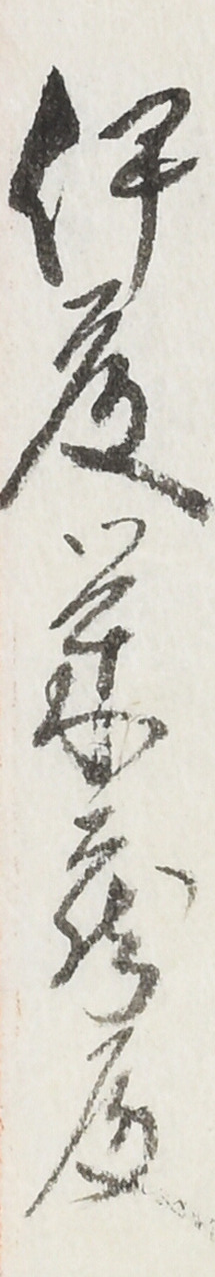伊藤栄蔵殿
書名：差出申一札之事
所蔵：伊那市立高遠町図書館・合同会社AMANE
